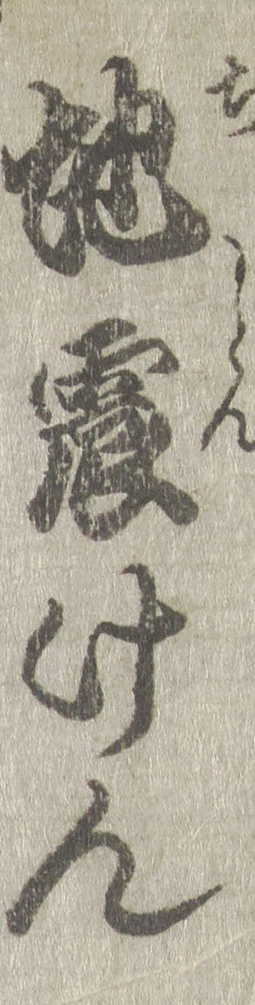地震けん
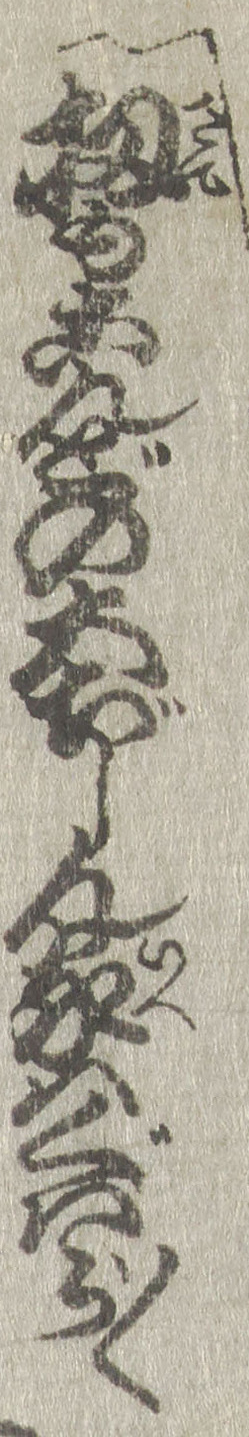「扨もこんどのおおぢしん家ハぐハら〴〵
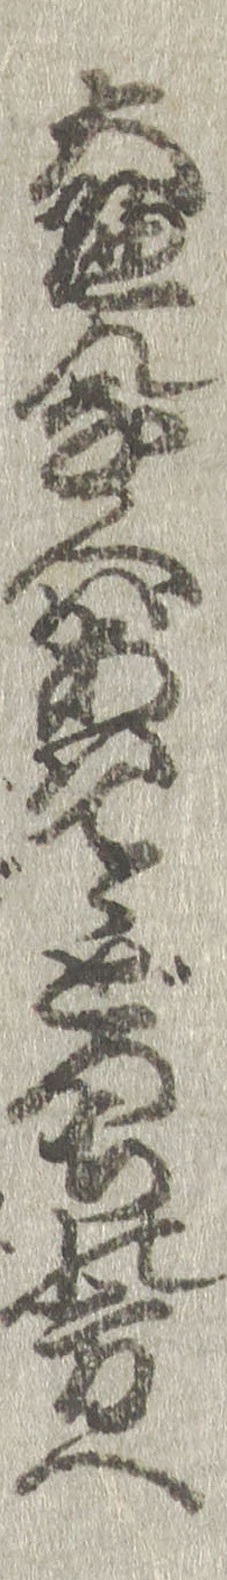大へんな壬人ハあわてゝどつちの方へ
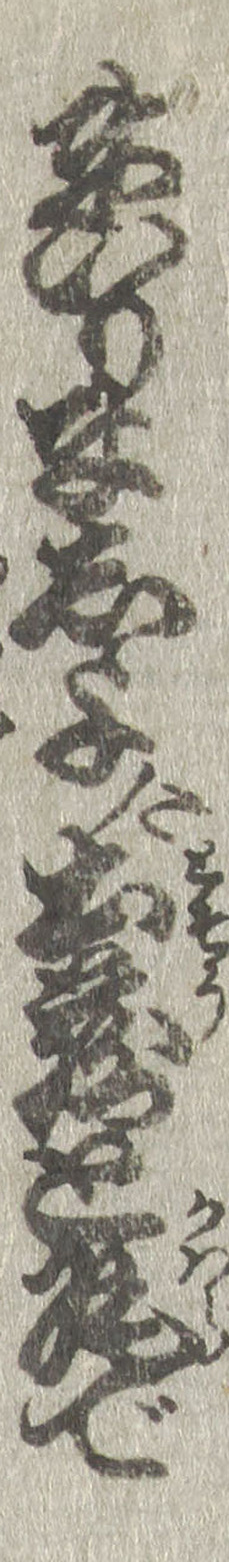まいりましよして土蔵と瓦で
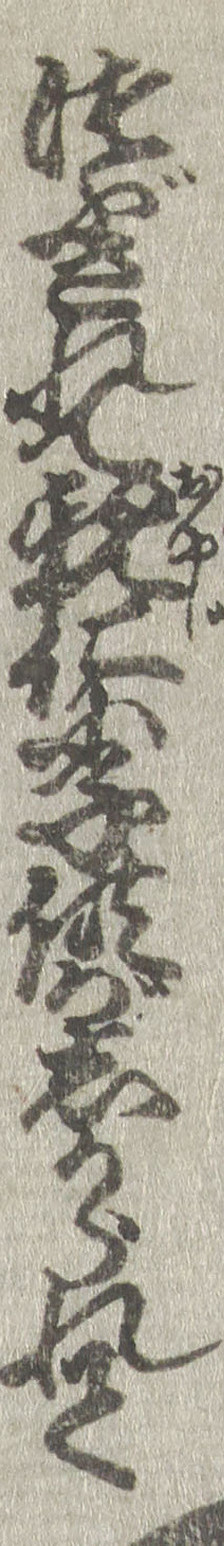つぶされて親仁に子供がしかられて
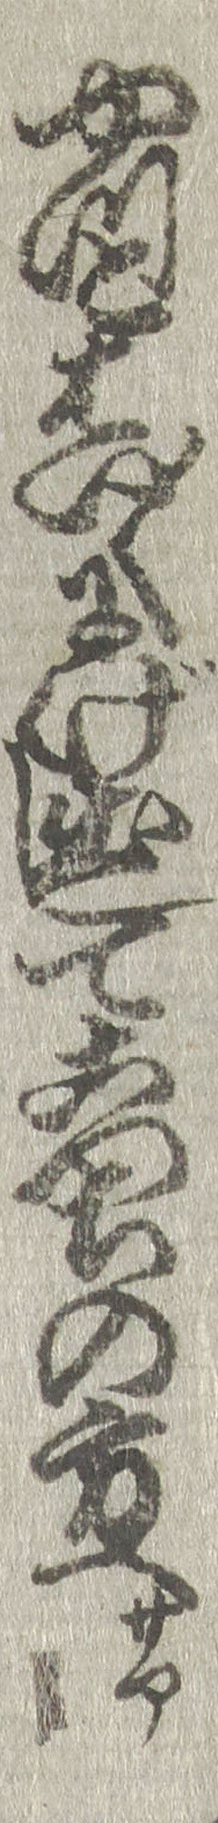やつとはい〳〵にげ出してあつちの方へサア
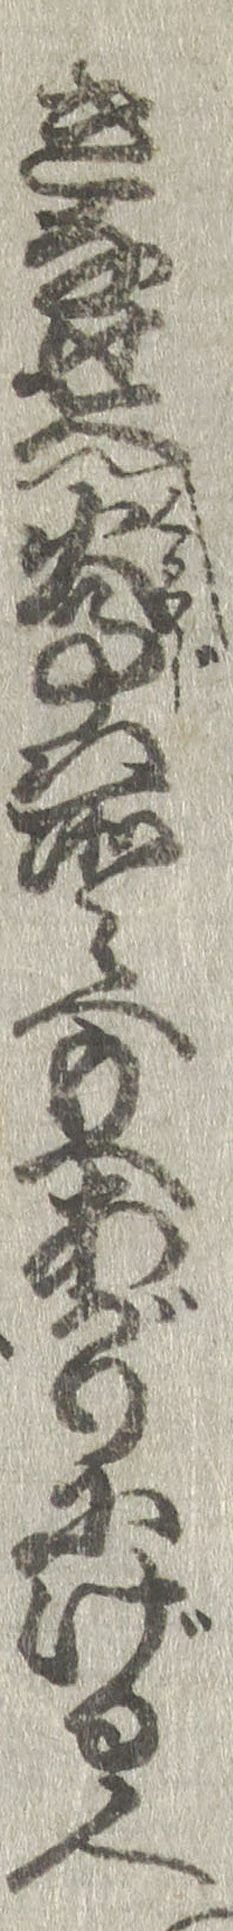きなせへ「火事ハ所々へもへあがりにげる人
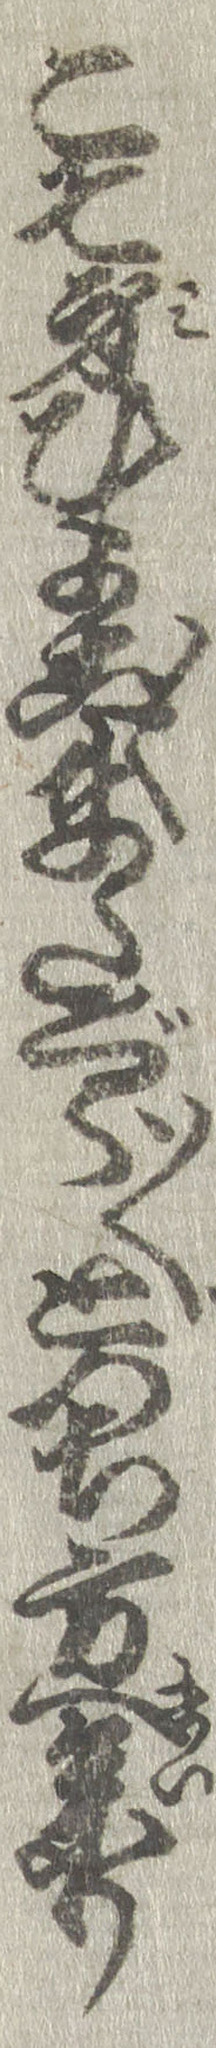こそ身ひあし〳〵またぐら〳〵どつち方へ参り
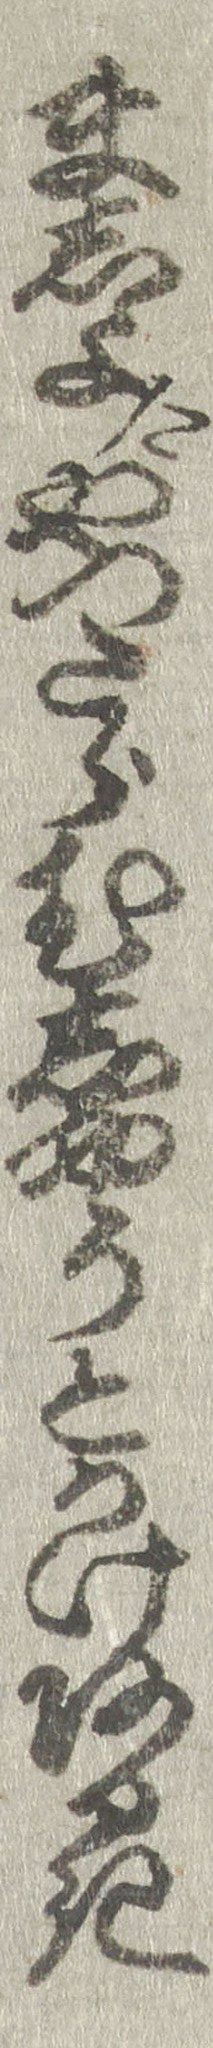ましよしてやつたらむしやうとかけあるき
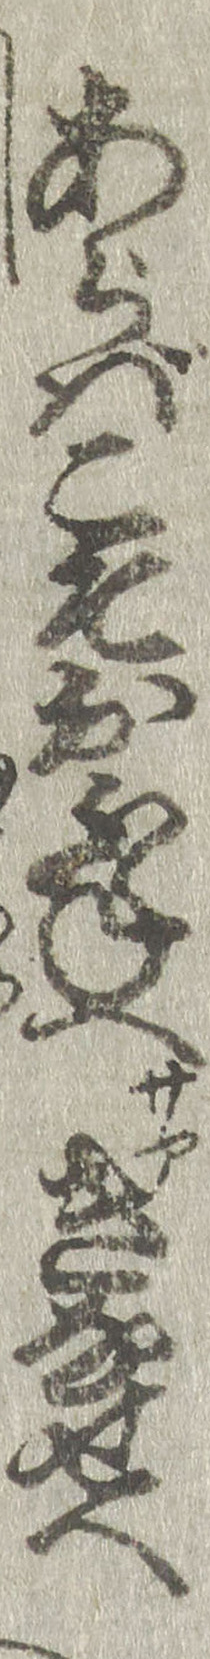あらバこそおふねへサアきなせへ
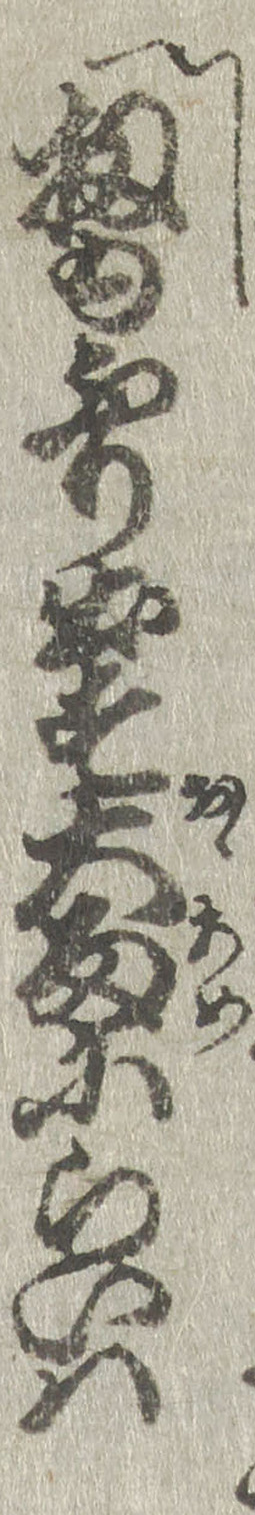「扨もふり出す大雨にらいハ
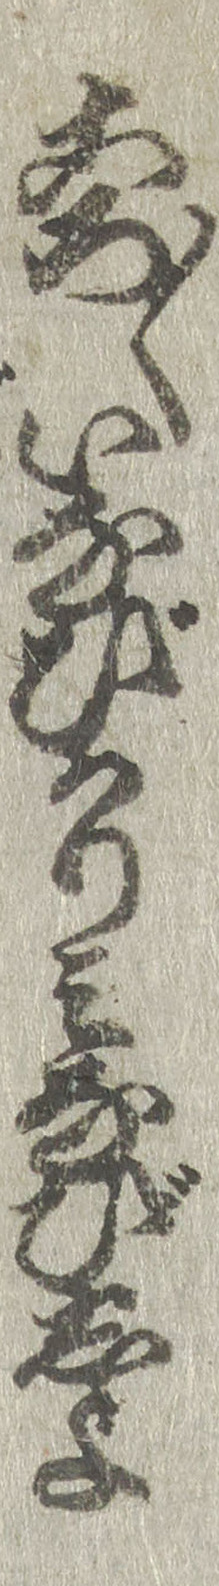おろ〳〵いなびかりミなびしよ
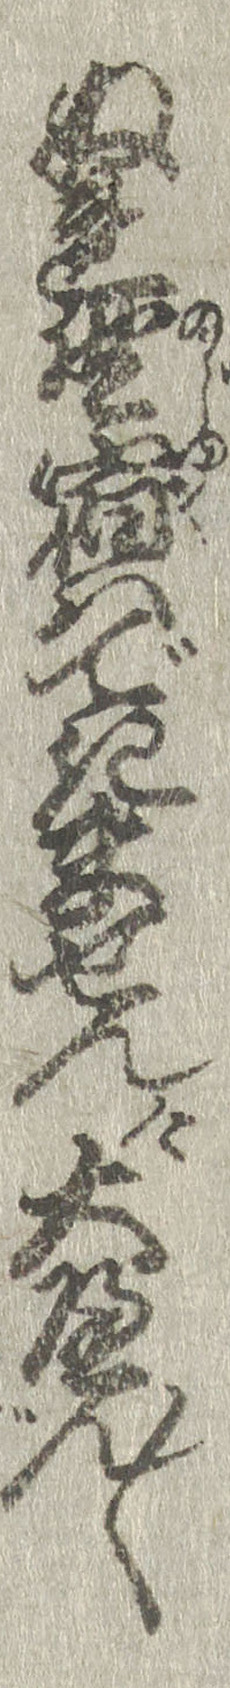ぬれ野宿はできませんして大へん〳〵
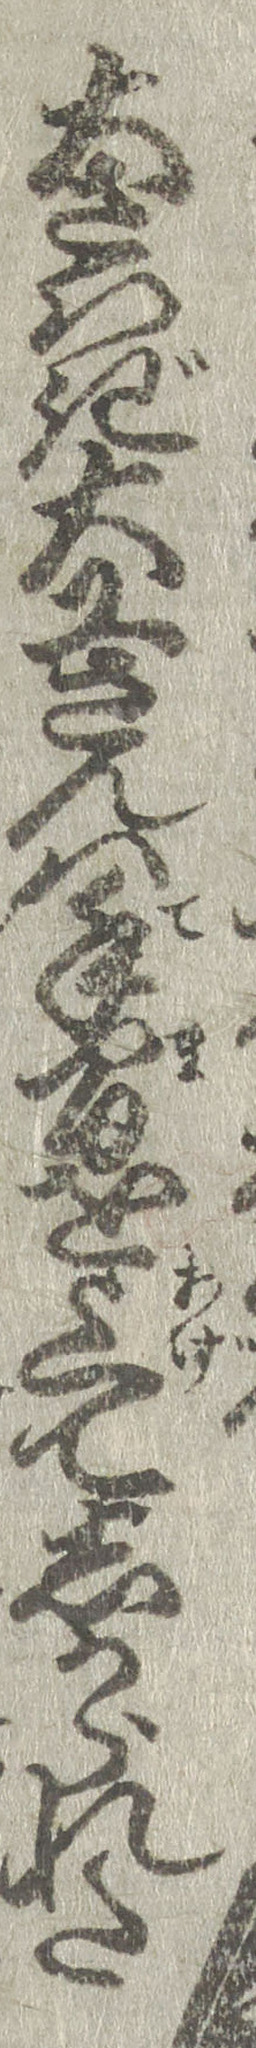大さハぎ大工さんハ手間を上てしかられたり
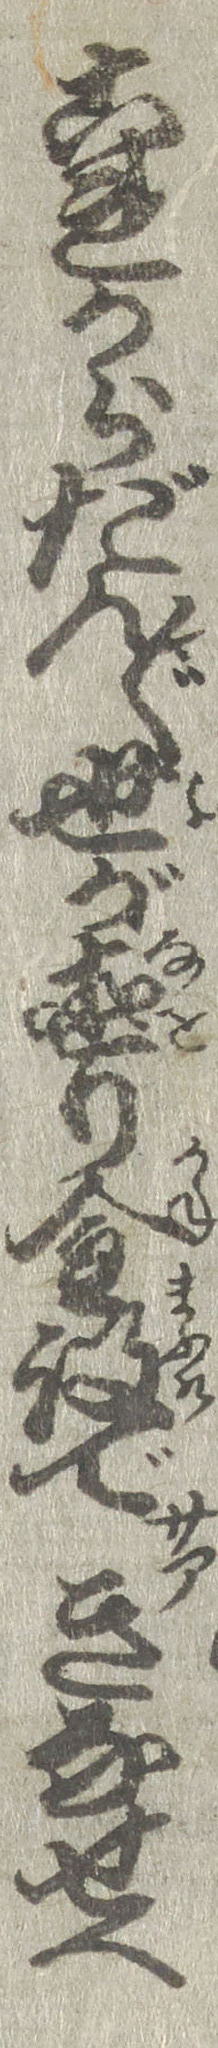これからだん〴〵世が直り金設でサアきなせへ
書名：地震けん
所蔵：東京大学総合図書館 General Library in the University of Tokyo, JAPAN
